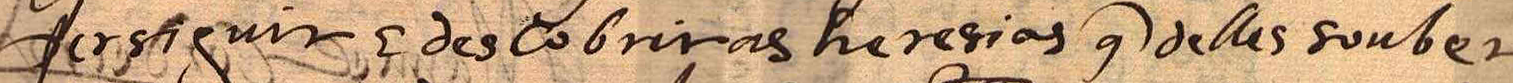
persiguir E descobrir as heresias q̄ delles souber
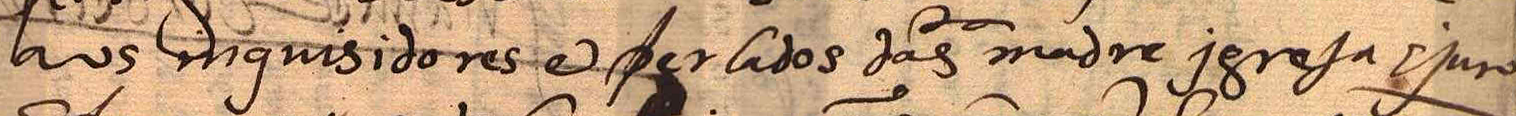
aos inquisidores e perlados da sta madre jgreJa E juro
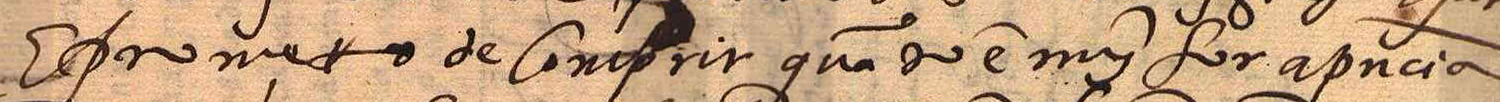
E prometto de Comprir quāto ē mȳ for a pn̄cia
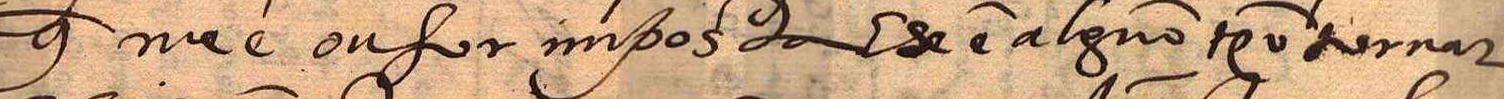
q̄ me é ou for imposta E se ē alguō tpō tornar
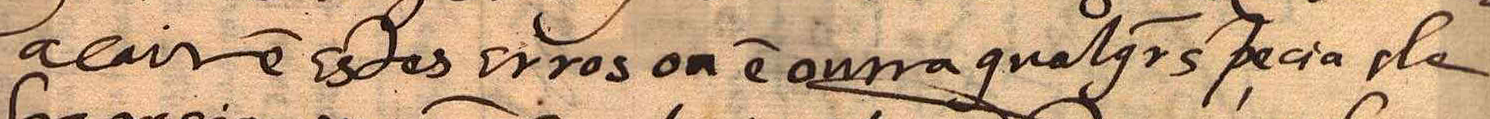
a cair ē Estes Erros ou ē outra qualqr̄ specia de
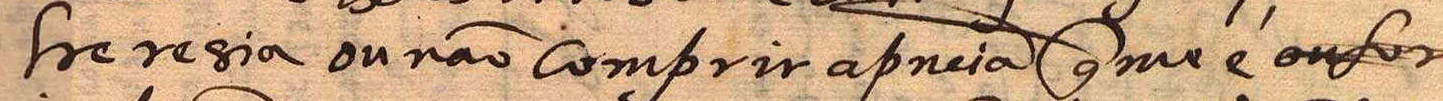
heresia ou não comprir a pnciā q̄ me é ou for
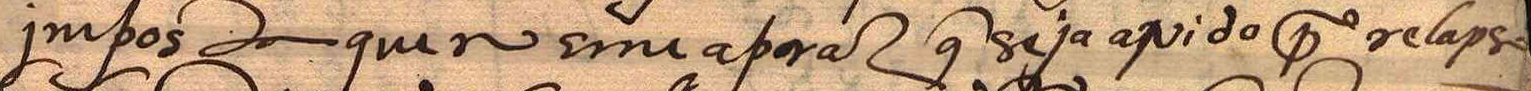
jmposta quero E me apraz q̄ seja avido p̄o relapso
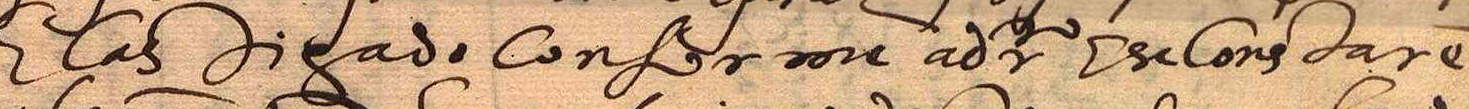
E Castigado conforme a drto E se Constar ē
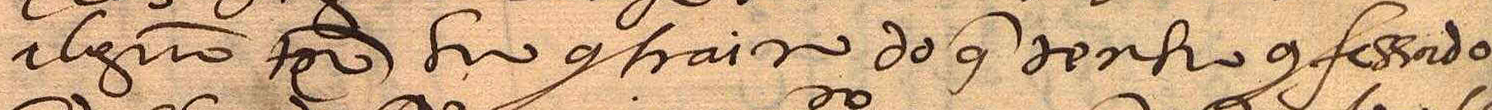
algūo tpō ho ꝯtrairo do q̄ tenho ꝯfessado
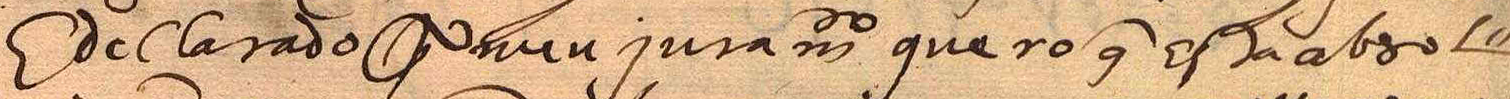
E declarado p̄o meu juramto quero q̄ Esta absol
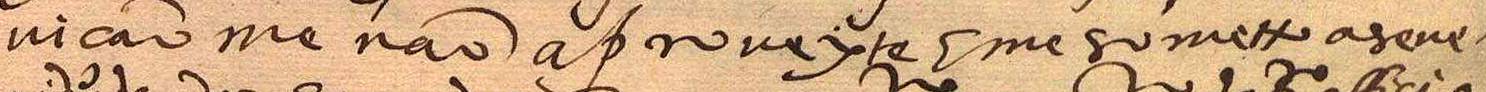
uição me naõ aproueyte E me sometto a seue
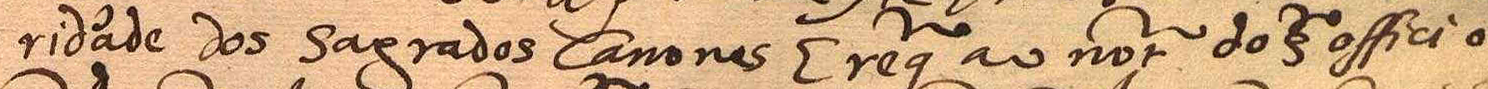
ridade dos Sagrados Canones E reqro ao notro do sto officio
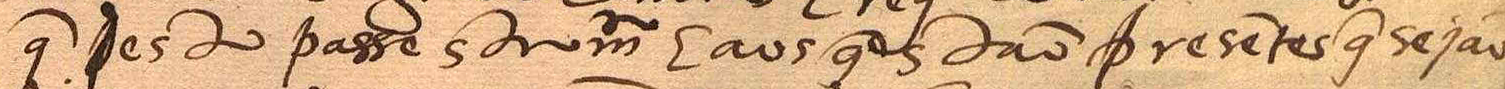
q̄ desto passe stromto E aos q̄ estaõ presētes q̄ sejaõ
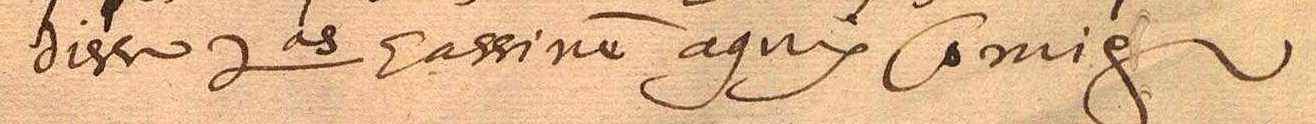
disso tas E assinē aquy Comigo
